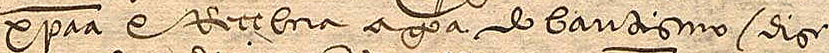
x̅paa e Recebera agoa do bautismo / dise
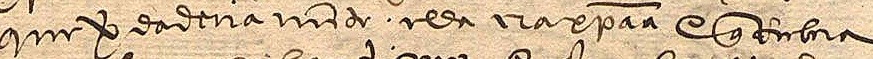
que ꝟerdadeirame̅te ella era xp̅aa e q̅ Recebera
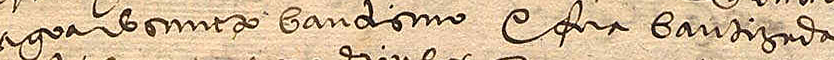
agoa do sancto bautismo e fora bautizada
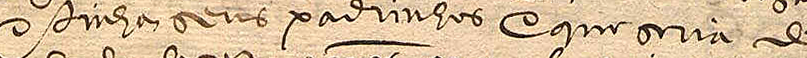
e tinha seus padrinhos e que seria de
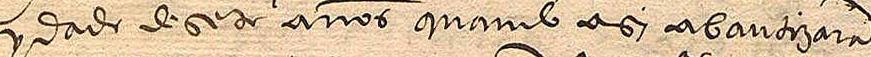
ydade de sete an̅os quando asy a bautizara̅
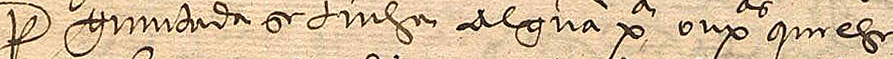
p̄gumtada se tinha algu̅a pa ou pas que lhe
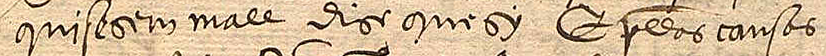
quisesem mall dise que sy E p̅llas causas
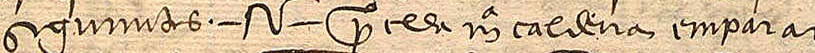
seguimtes. -ss- p̄o ella ma caldeira emparar
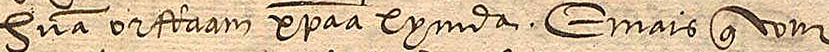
hu̅a orffaam x̅paa lymda. E mais q̅ com
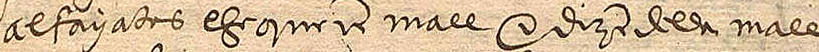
alfayatas lhe quere̅ mall e dize̅ della mall
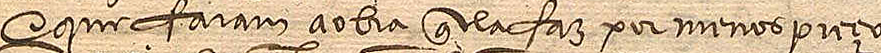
e que faram a obra q̅ ela faz por menos preço
